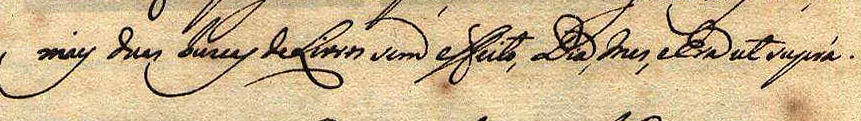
mais duas buzcas de Livros sem effeito, Dia, mes, e Era ut suprá.
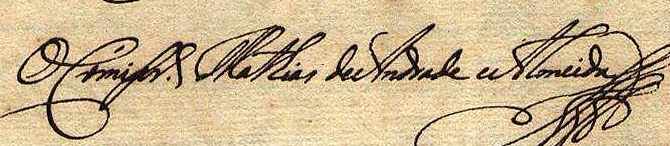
O Comissr.o Mathias de Andrade e Almeida
